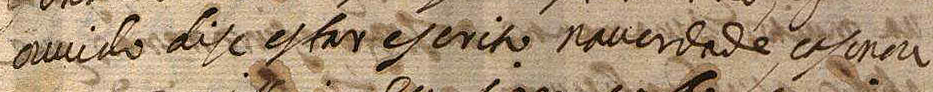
ouuido dise estar escrito na uerdade, e asinou
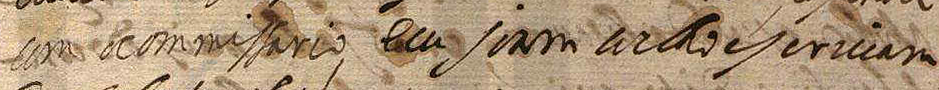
com o commissario, e eu joam coelho escriuam
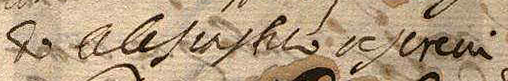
do eclesiastico o escreui
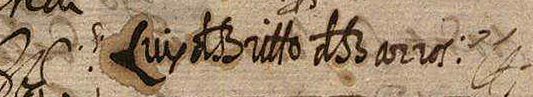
Luis d̄ Britto d̄ Barros
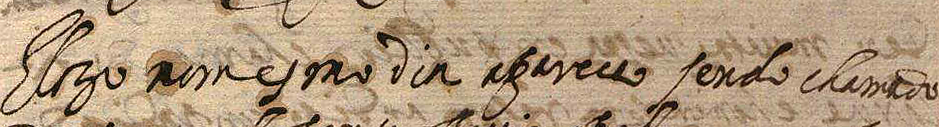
E logo no mesmo dia apareceo sendo chamado
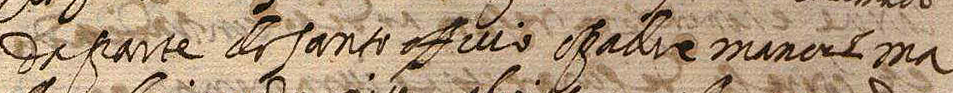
da parte do santo officio o padre manoel ma
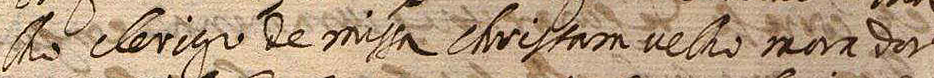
lho clerigo de missa christam uelho morador
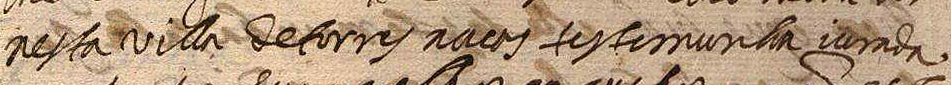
nesta villa de torres nouas testemunha iurada
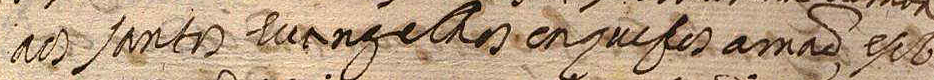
aos santos Euangelhos en que pos a mão, e sob
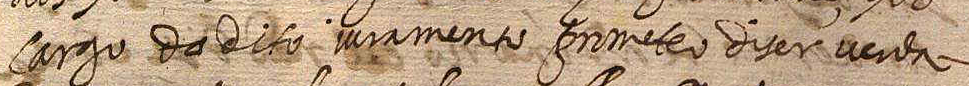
cargo do dito iuramento prometeo diser uerda
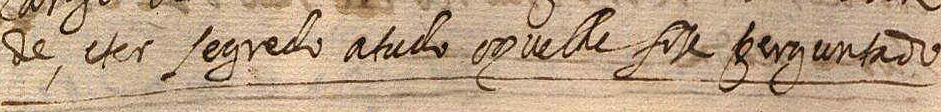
de, e ter segredo a tudo o que lhe fose perguntado
